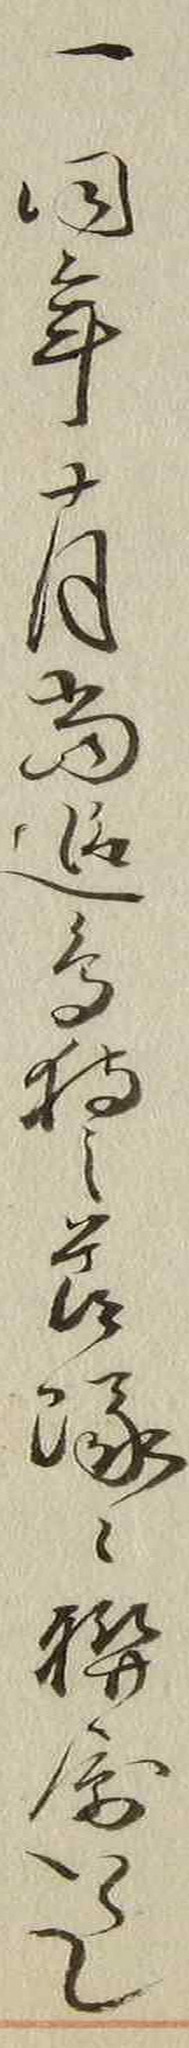一同年月十当追鳥狩之節隊々聯属いたし
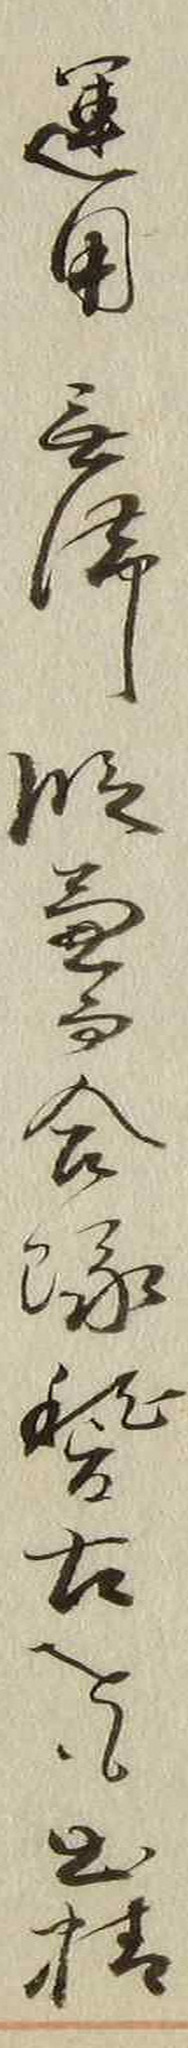運用無滞段兼而合隊稽古をも出精
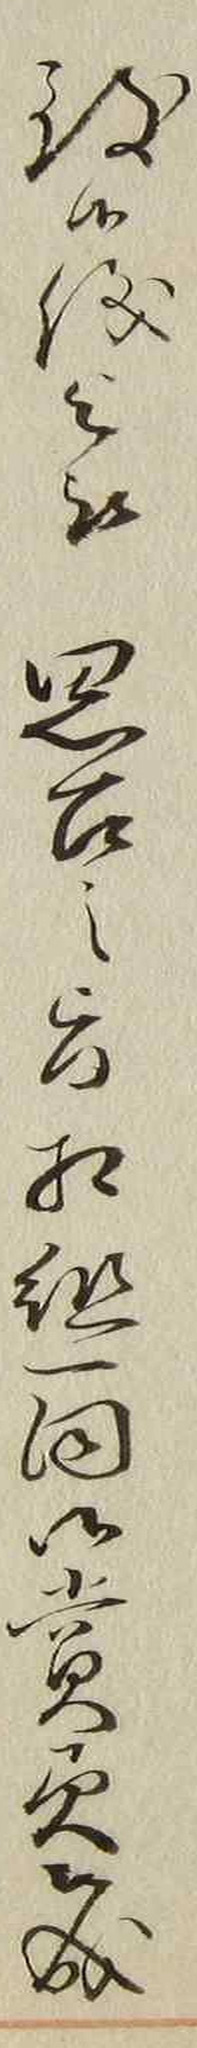致候儀与被思召之旨相組一同御賞美被成
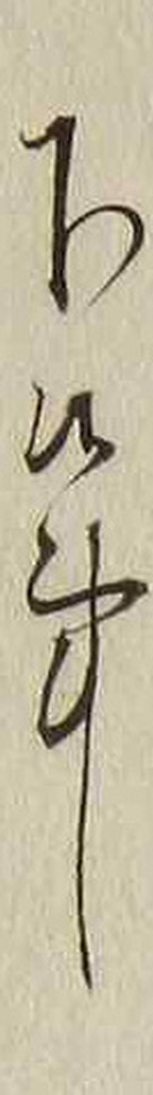下候事
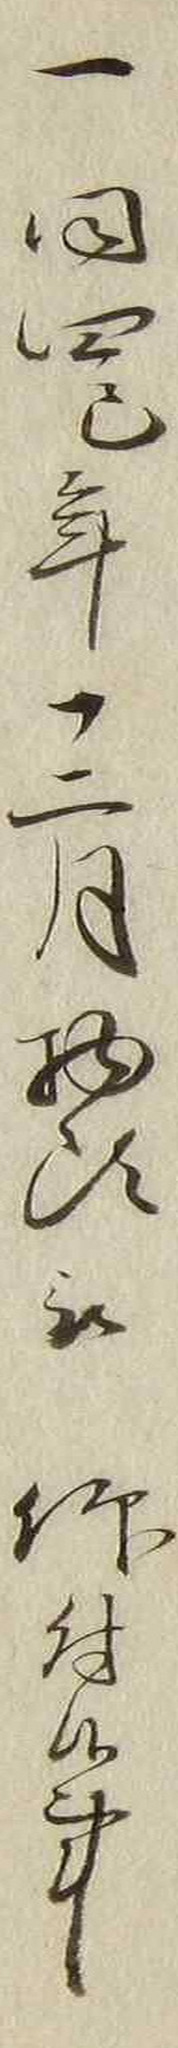一同四巳年十二月物頭被仰付候事
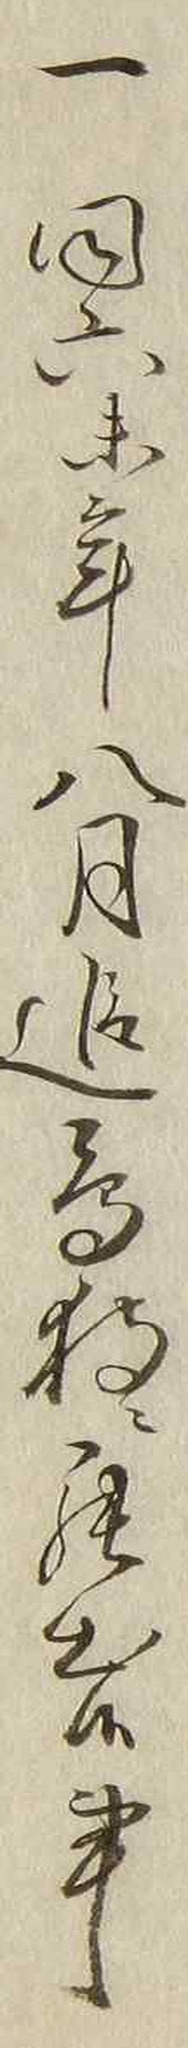一同六未年八月追鳥狩ニ罷出候事
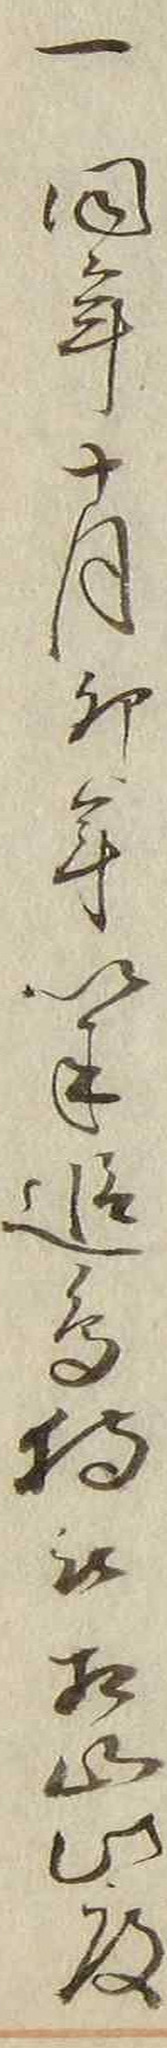一同年十月卯年以来追鳥狩被相止此度

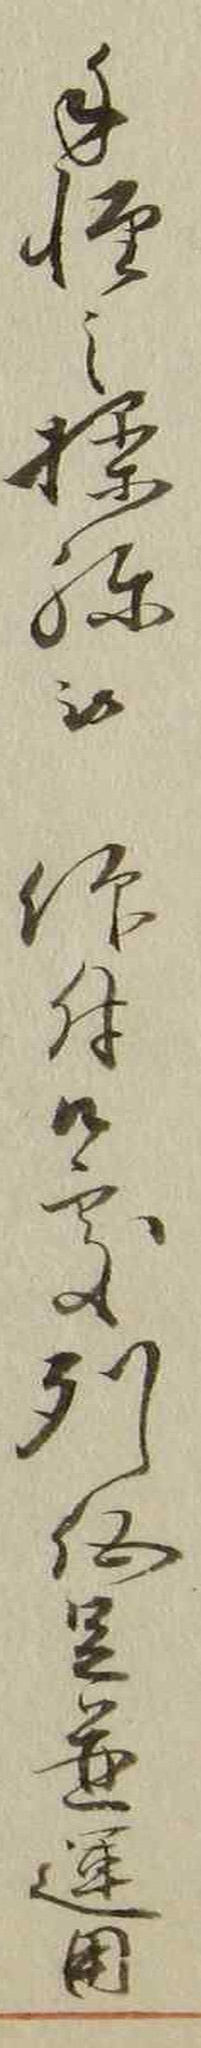手軽之操練被仰付候処列伍足並運用
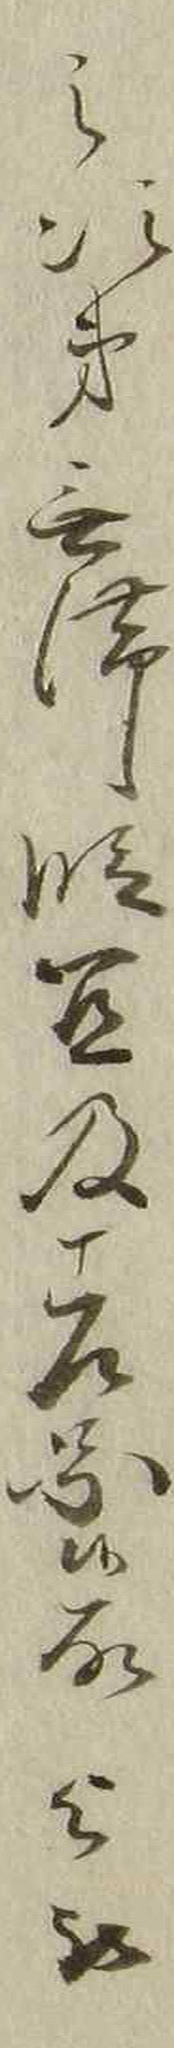之次第無滞段宜及差図候故与被
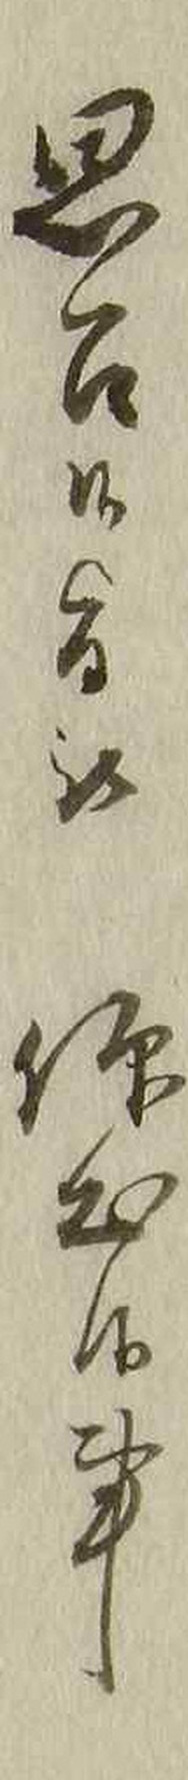思召候旨被仰出候事
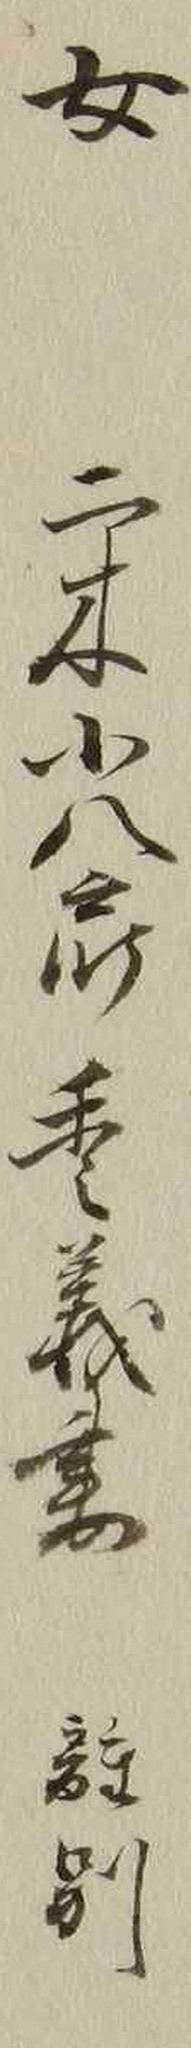女二木小八郎重義妻離別
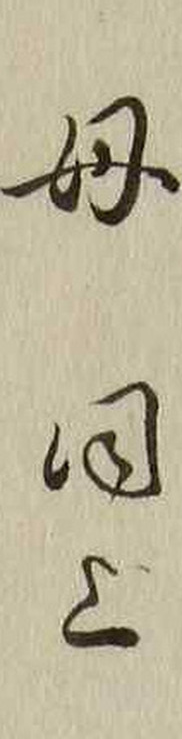母同上
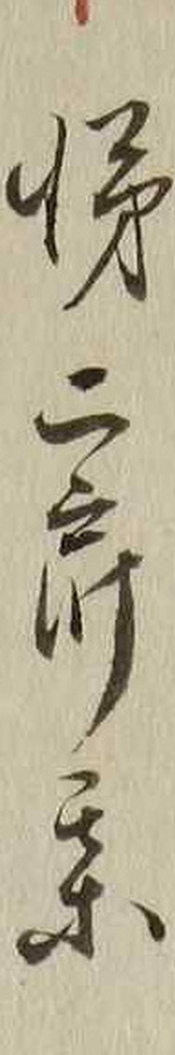悌二郎某
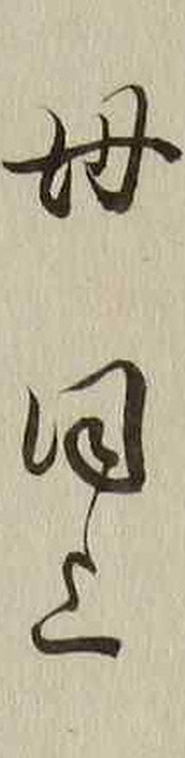母同上
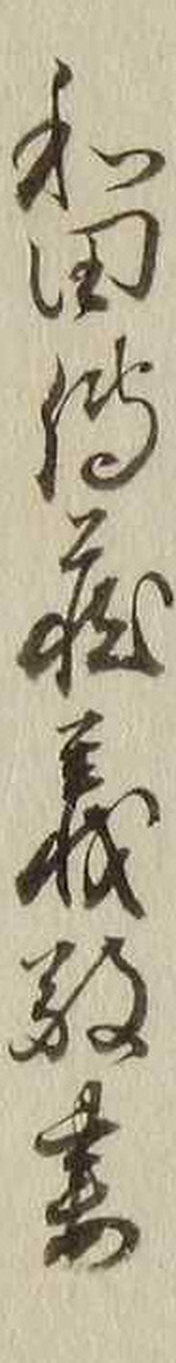女和田伝蔵義敬妻
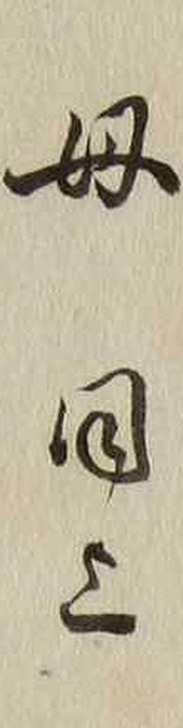母同上
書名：諸士系譜　巻之122　よ之部5
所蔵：会津若松市立会津図書館
